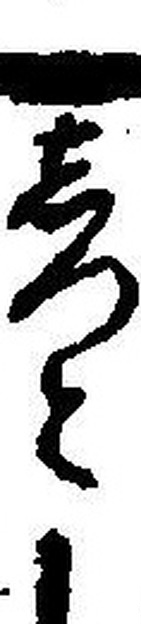しつと
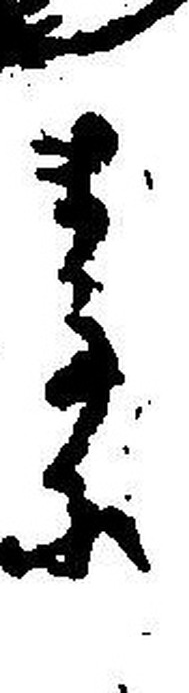ま事に
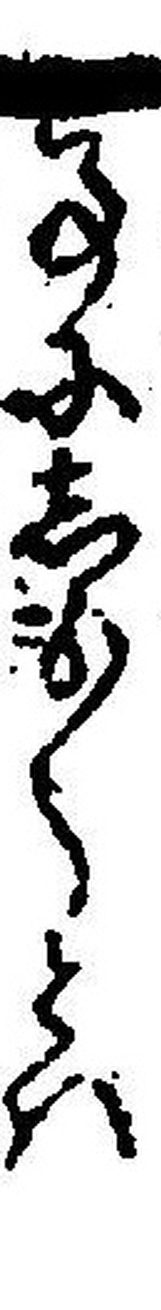事にしも〳〵とは
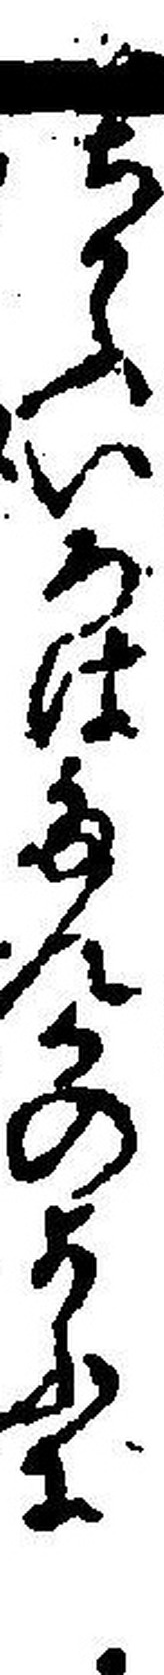ちかふいろはたんかのよふに
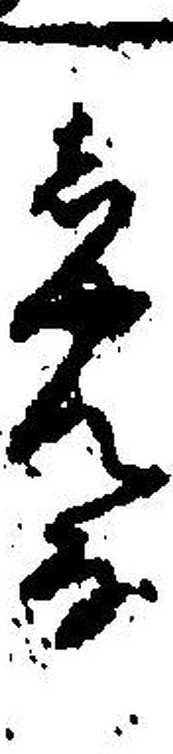しやんな
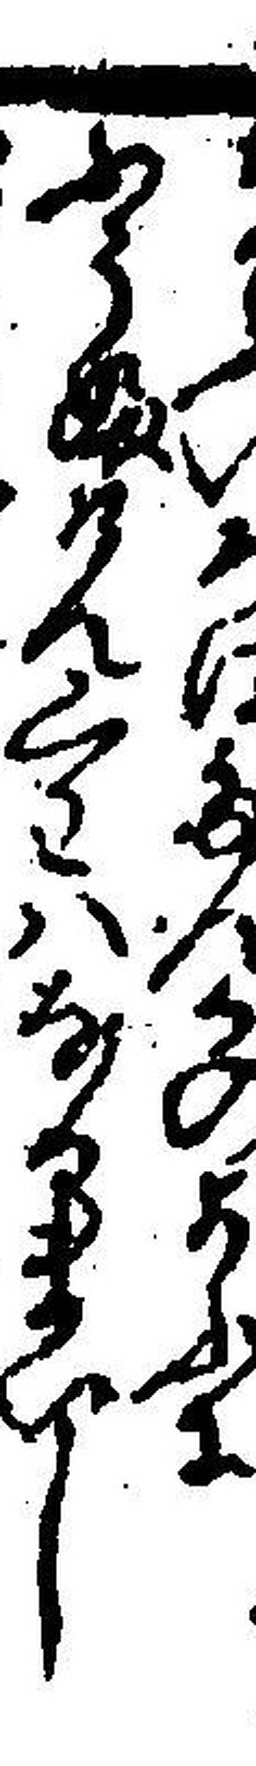ふうふけんくわはなるまいし
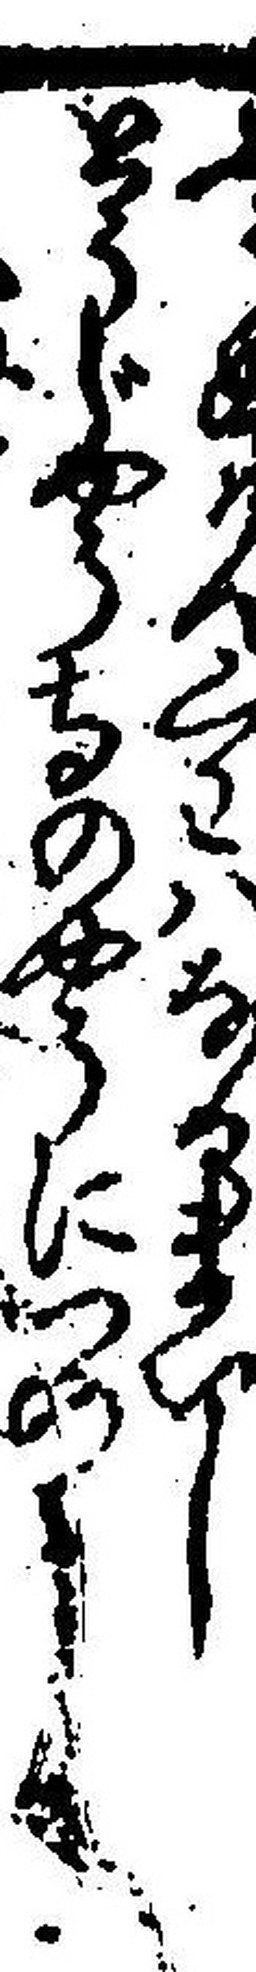とうじやう寺のやうにつのゝ
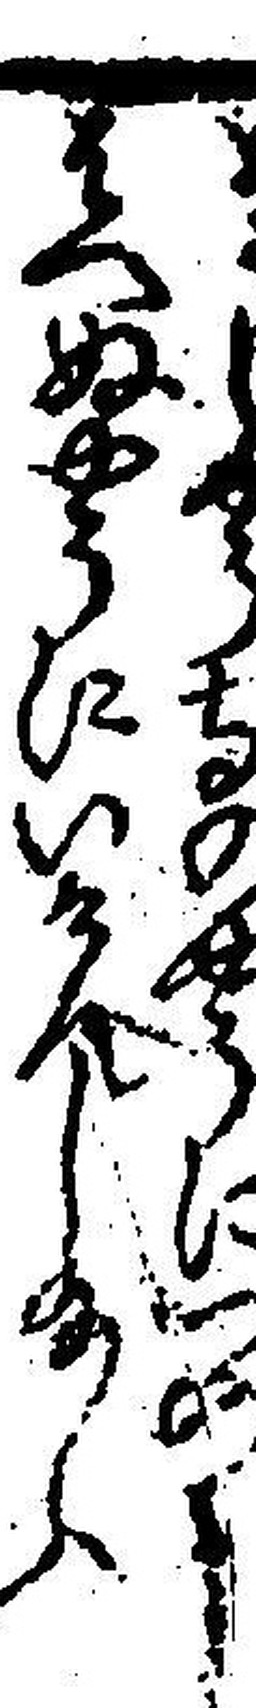はへぬやうにいけんし給ふ

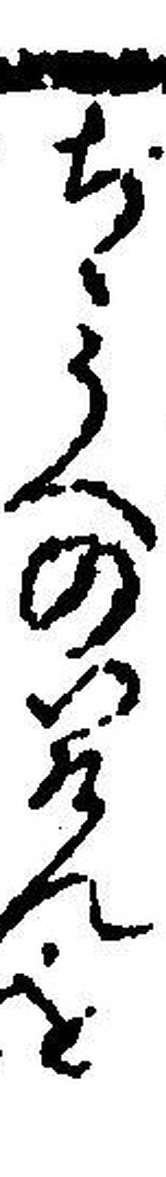ちゝうえのいけんを
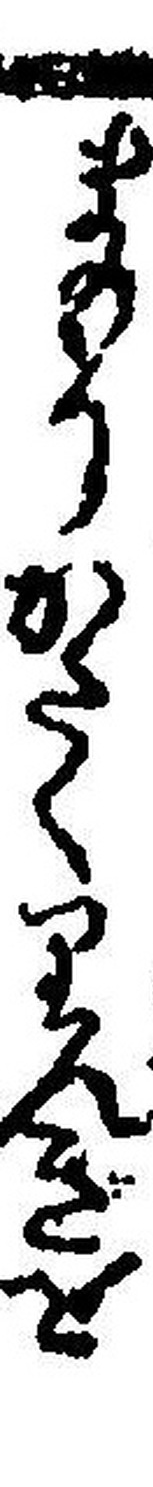まもりかたくりんきを
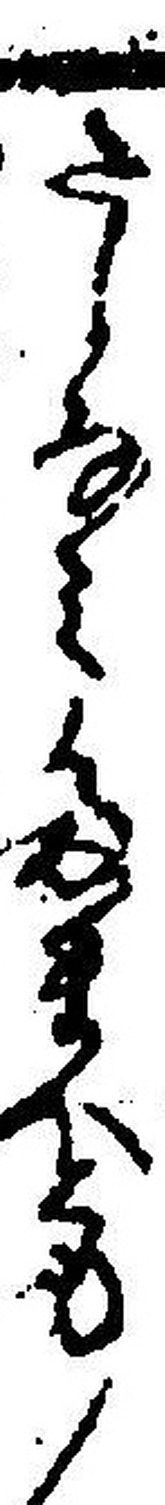たしなみたまへとも
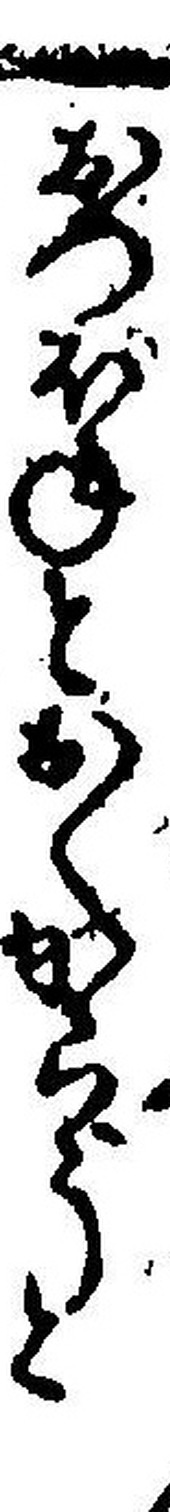おつぼねとおくからうと
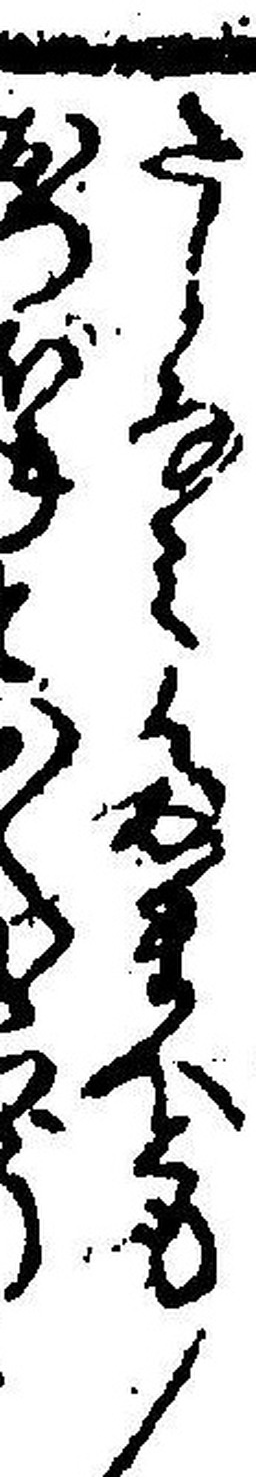おつぼねとおくからうと
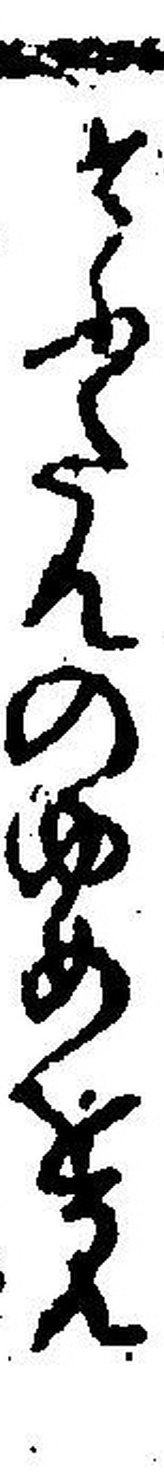そふたんのゆめを見
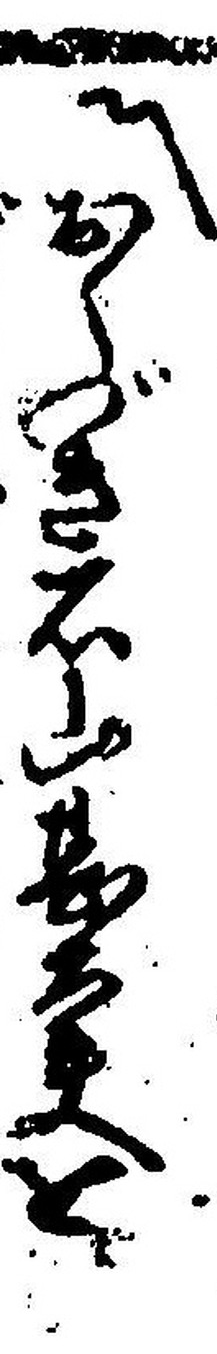〽おくづき石山甚太夫を
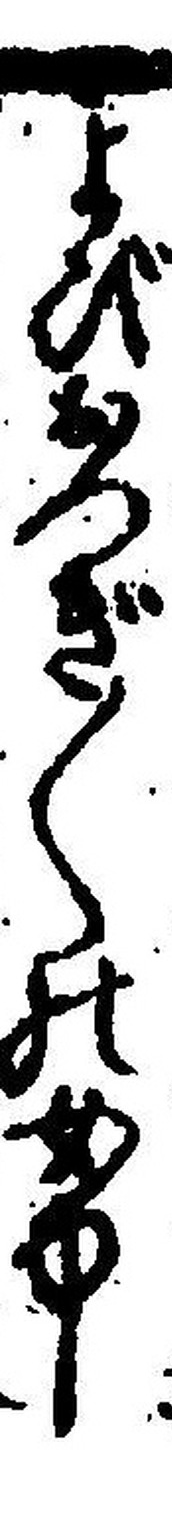よびおつぎ〳〵の女中
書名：御代参牛時詣 / 市場通笑作
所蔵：東京大学総合図書館 General Library in the University of Tokyo, JAPAN
